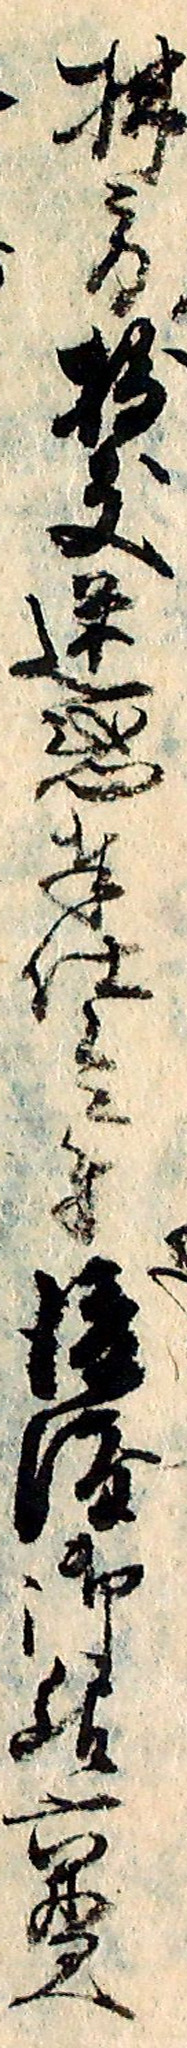払方指支迷惑奉仕候に付後渡御銀六貫
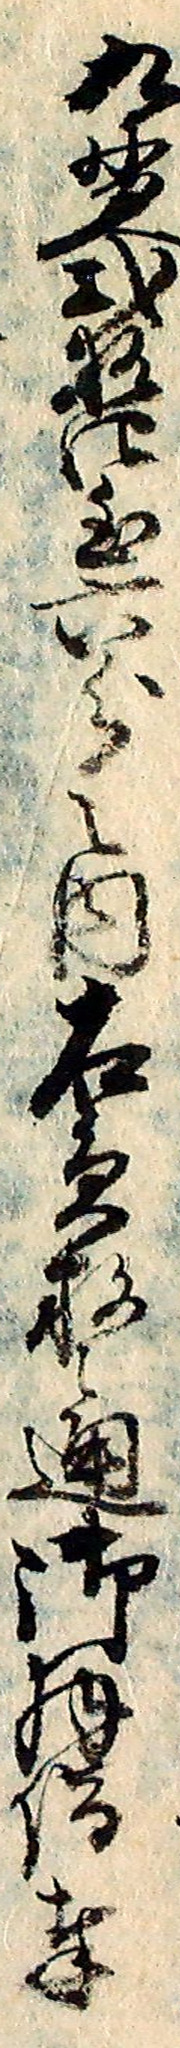九貫弐拾四匁六分之内右員数之通御拝借奉
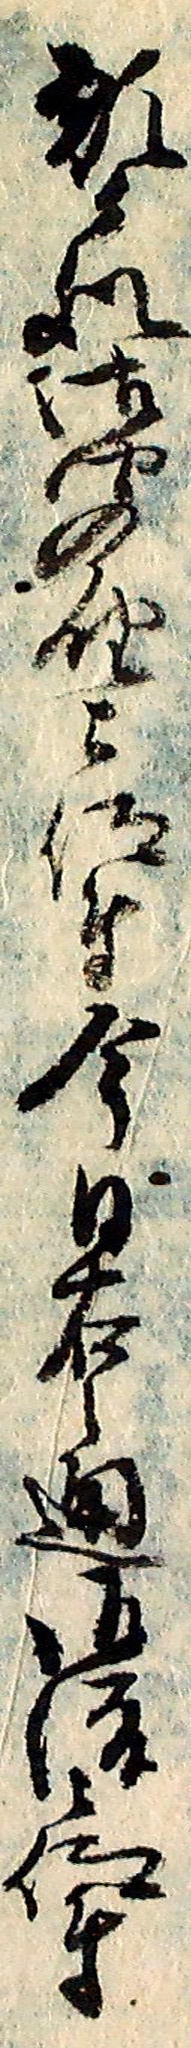願候処御聞届被仰付今日右之通御渡被仰付
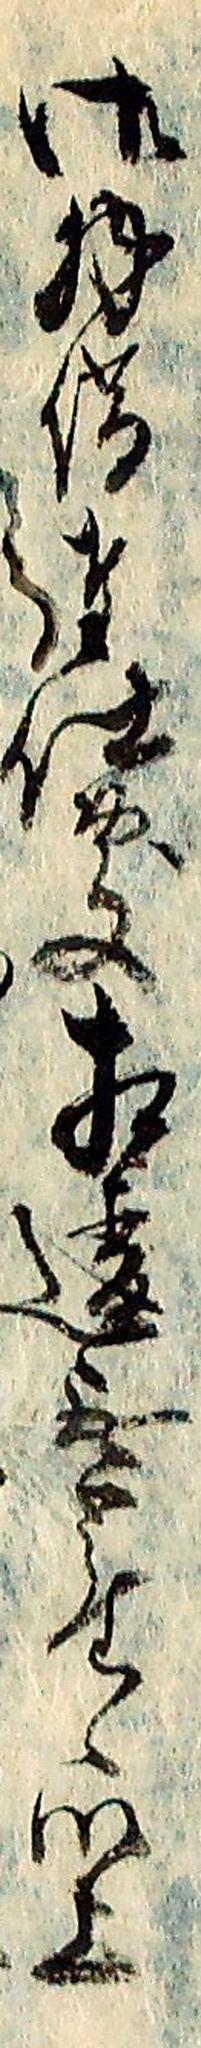御拝借奉仕処相違無御座候以上
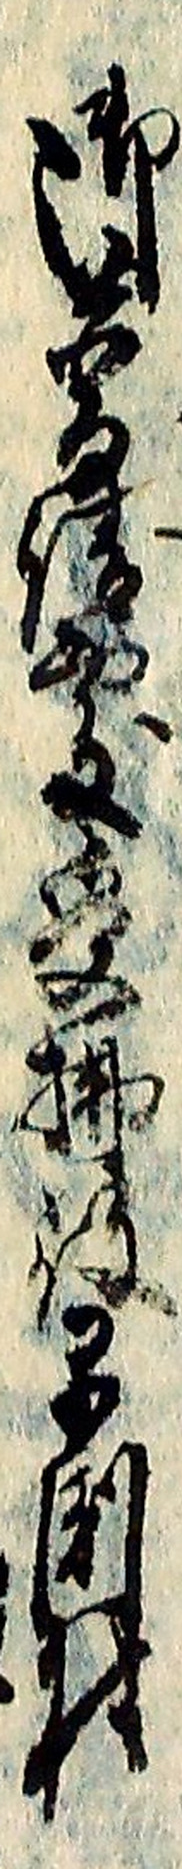御普請処受払役早淵村
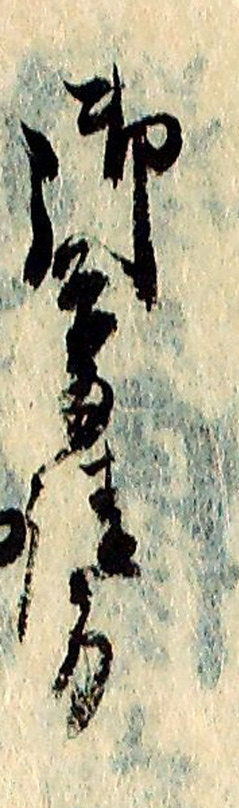御普請方
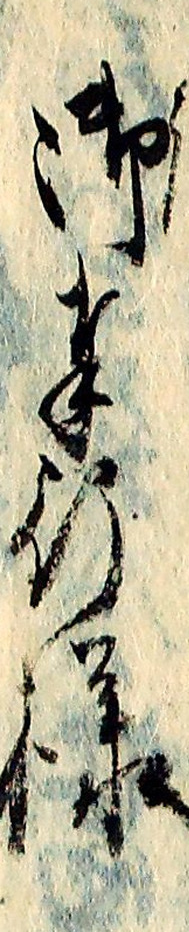御奉行様
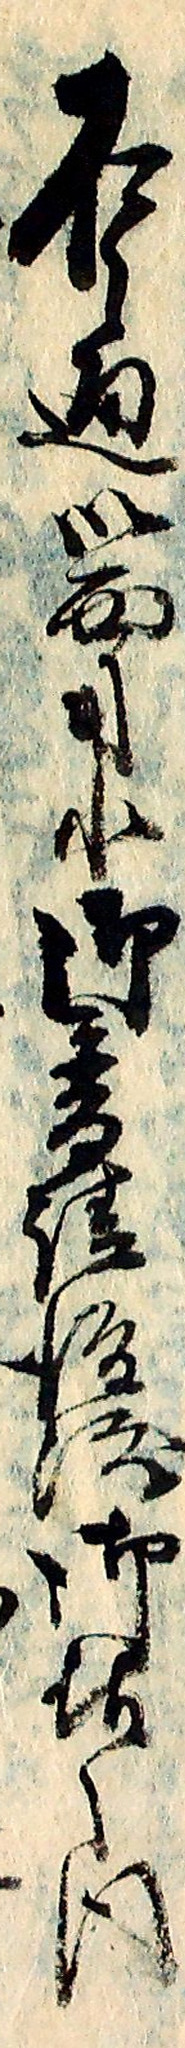右之通以西用水御普請後渡御銀之内
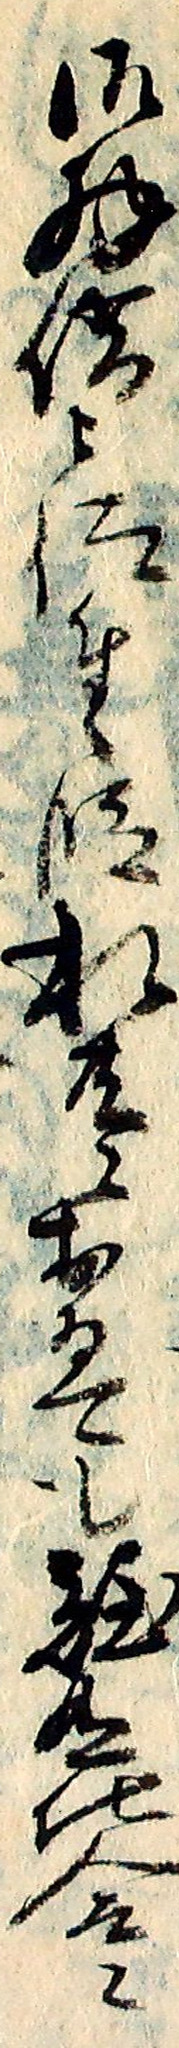御拝借被仰付候段私共におゐても難有仕合に
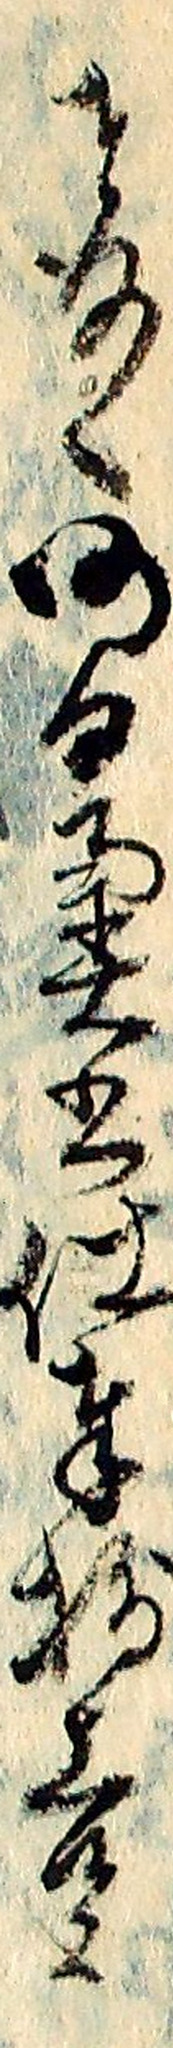奉存候仍て奥書仕奉指上候以上
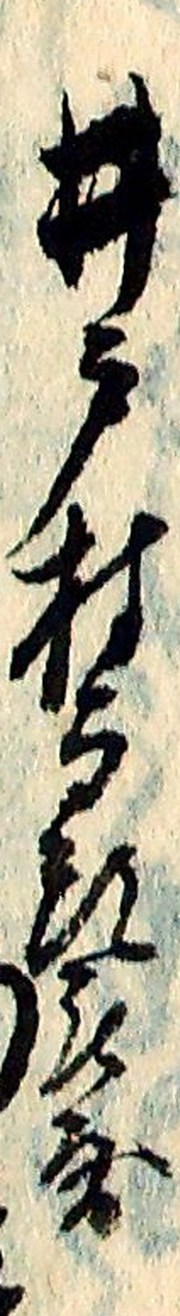井戸村与頭庄屋
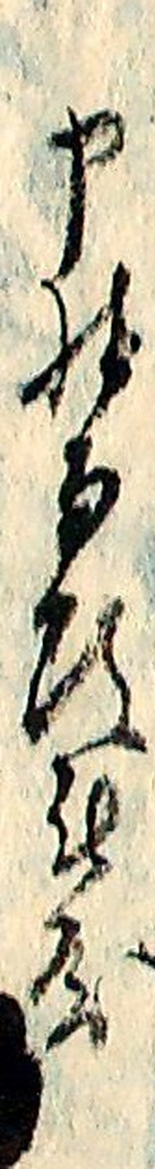中村与頭庄屋
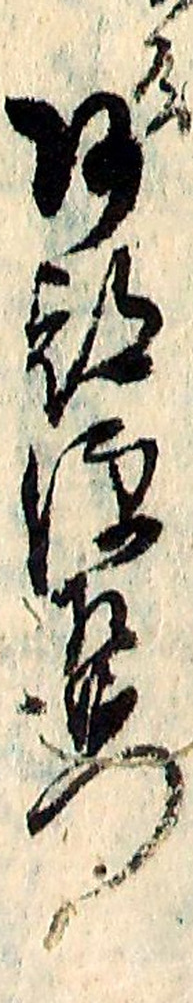阿部源左衛門
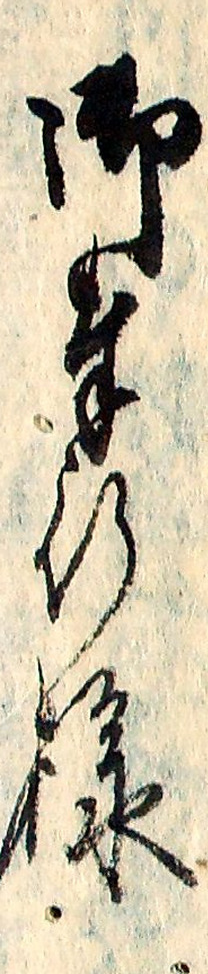御奉行様

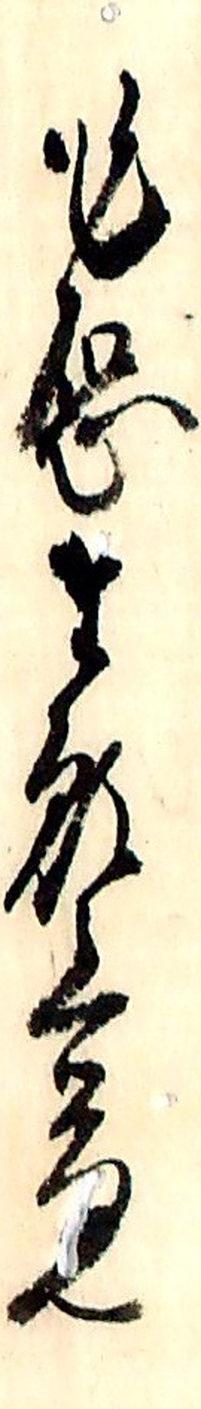乍恐奉願上覚
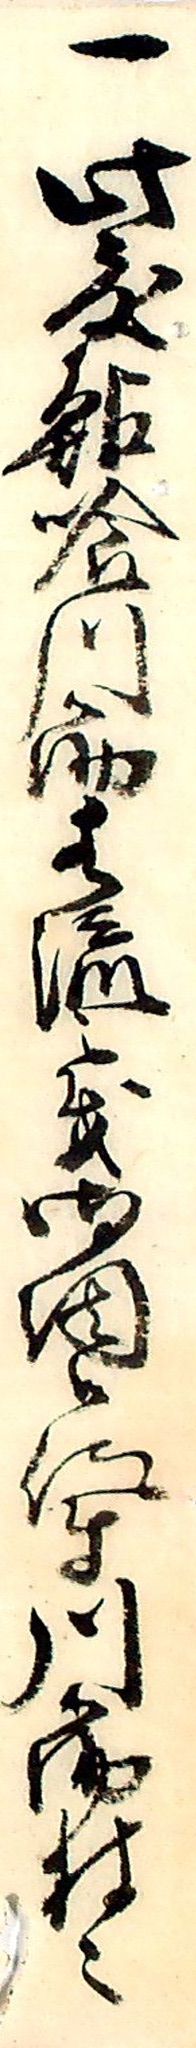一此度鮎喰川筋水流之義御調被仰付川筋村々
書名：諸御願書控(後藤氏壱番）
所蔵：鳴門教育大学 Naruto University of Education
